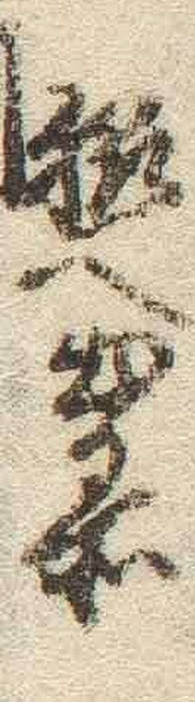脇へ出る所
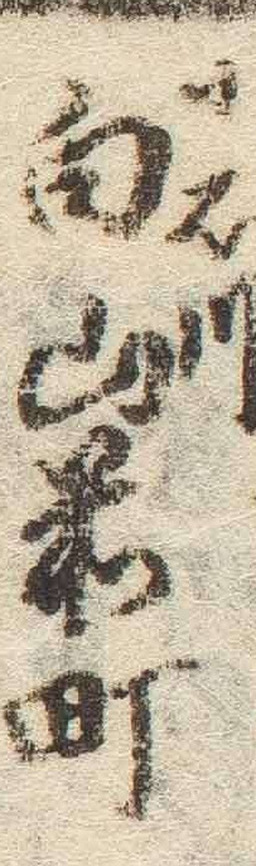白山前町
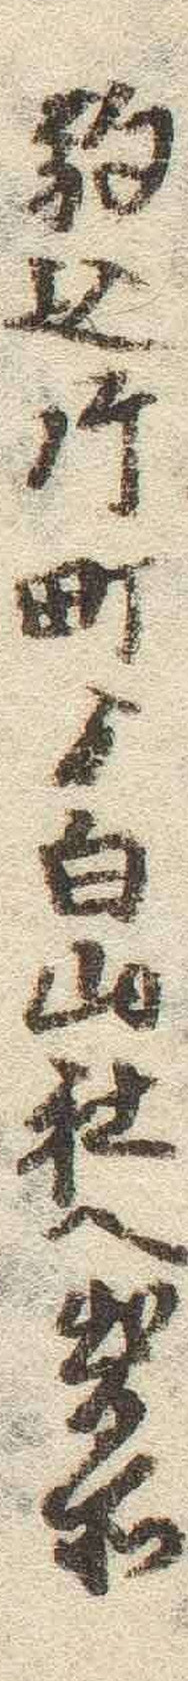駒込片町より白山社へ出る所
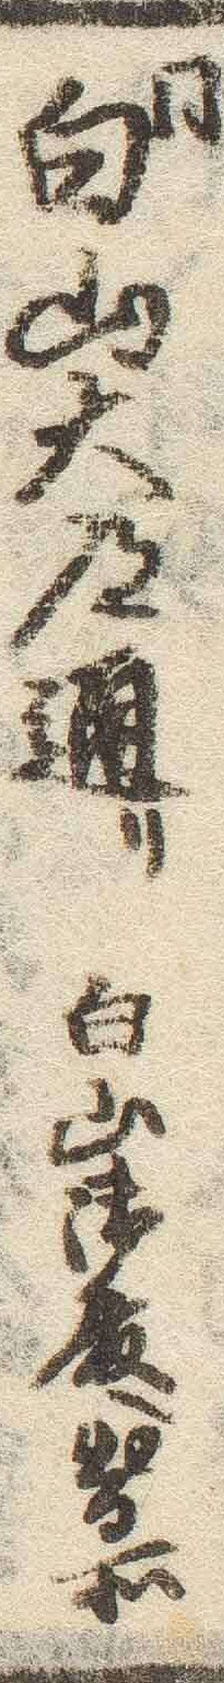白山大道通り白山御殿へ出る所
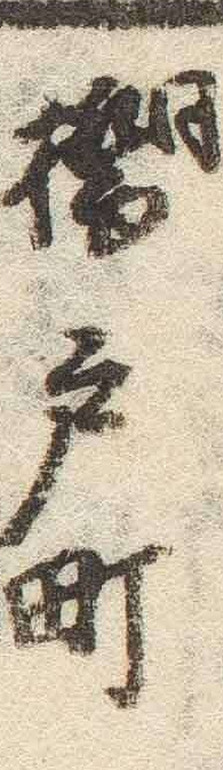橋戸町
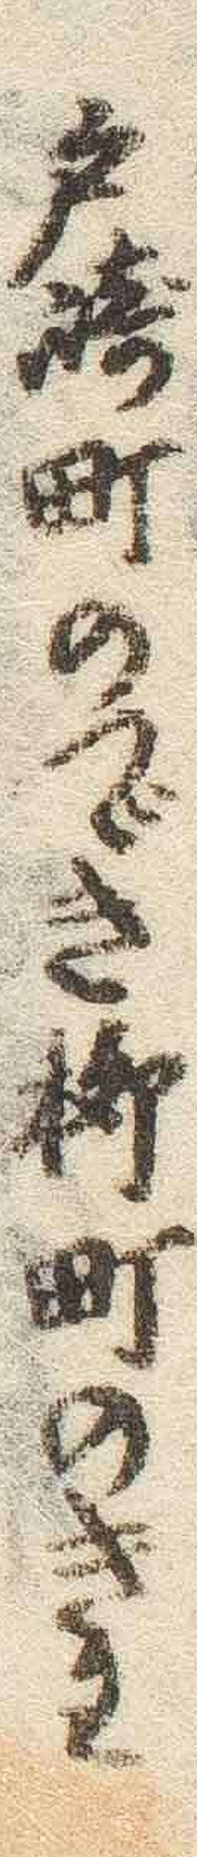戸崎町のつゞき柳町のきわ
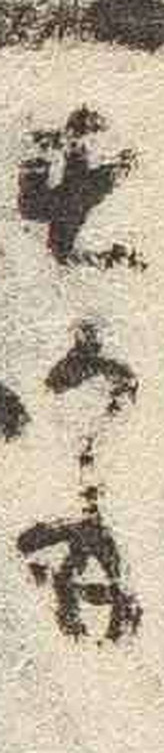すかも
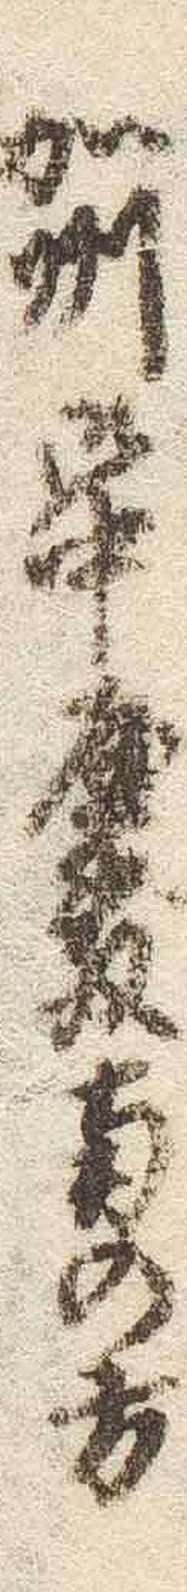加州御中屋敷南の方
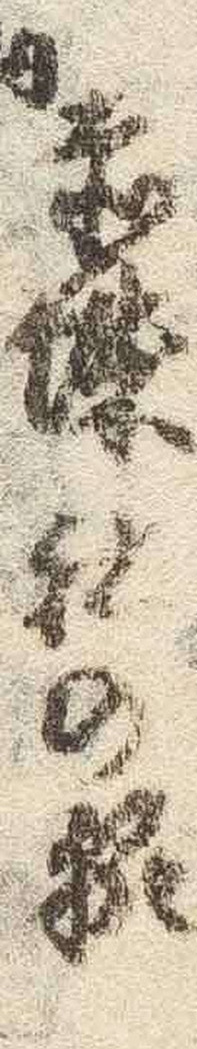赤城社の脇
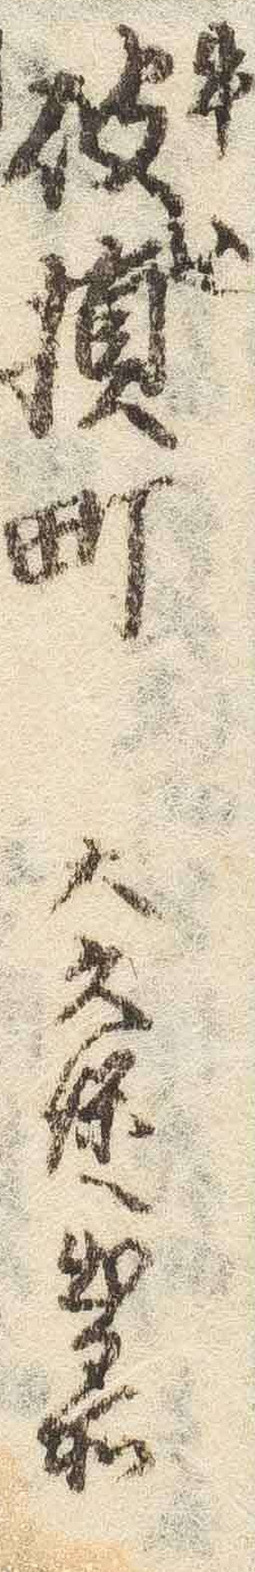破損町大久保へ出る所
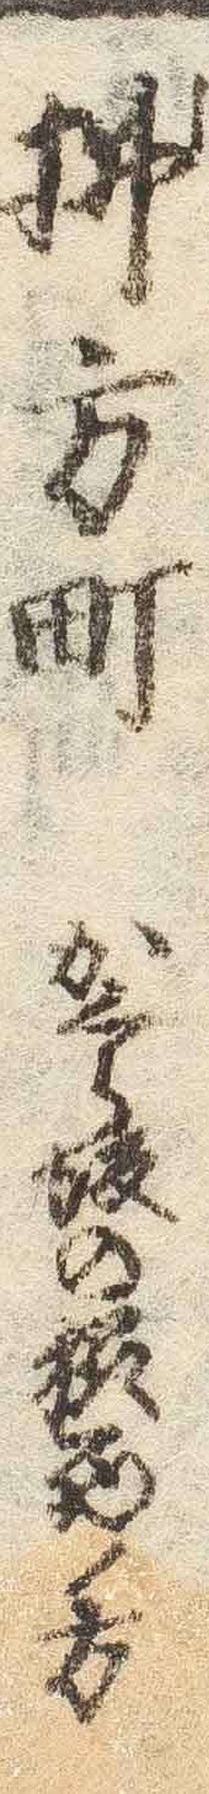払方町かくら坂の脇西ノ方
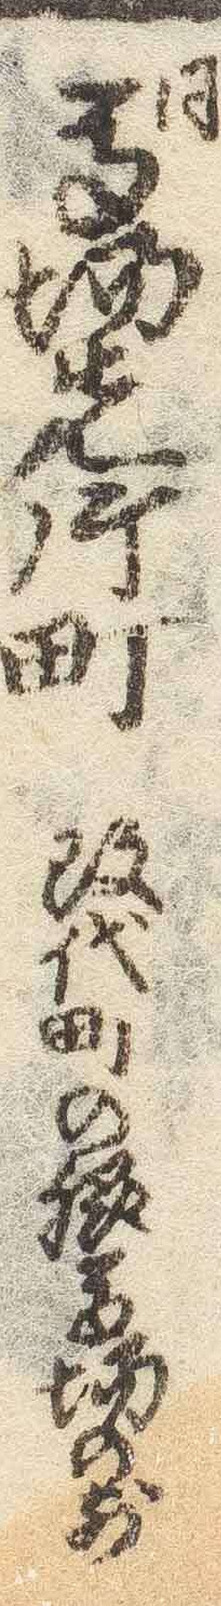馬場先片町改代町の脇馬場の前
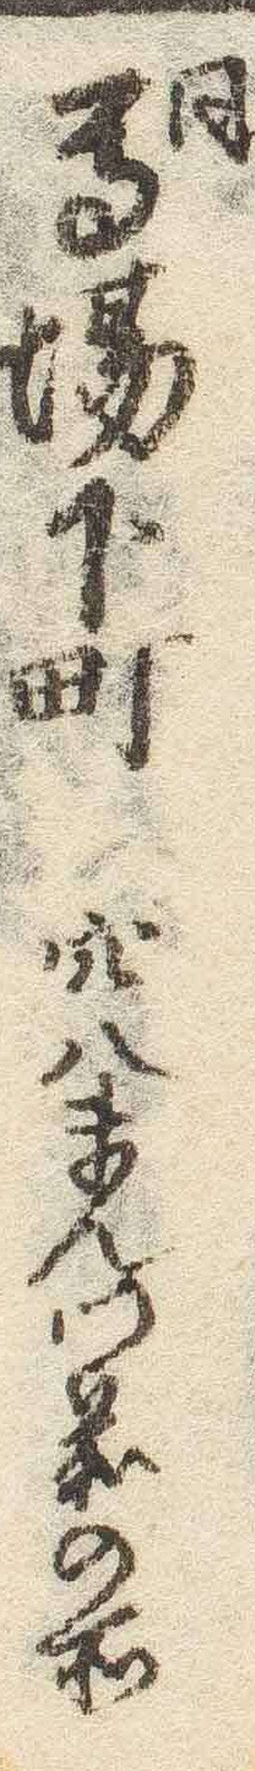馬場下町穴八まん門前の所
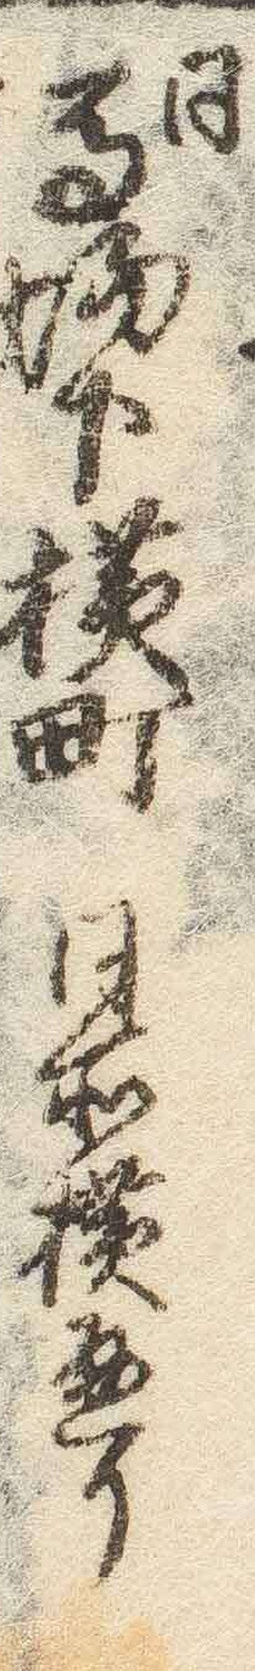馬場下横町同所横通り
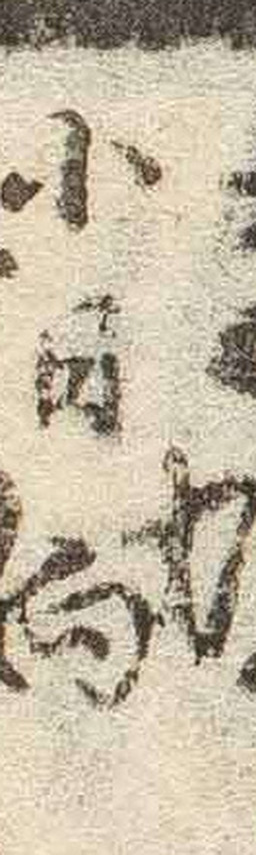小日向
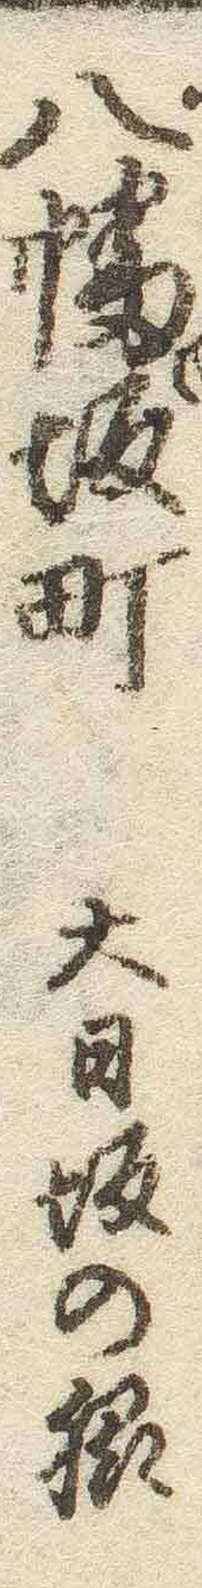八幡坂町大日坂の脇
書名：江戸町独案内
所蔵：東京学芸大学附属図書館 国文学研究資料館
